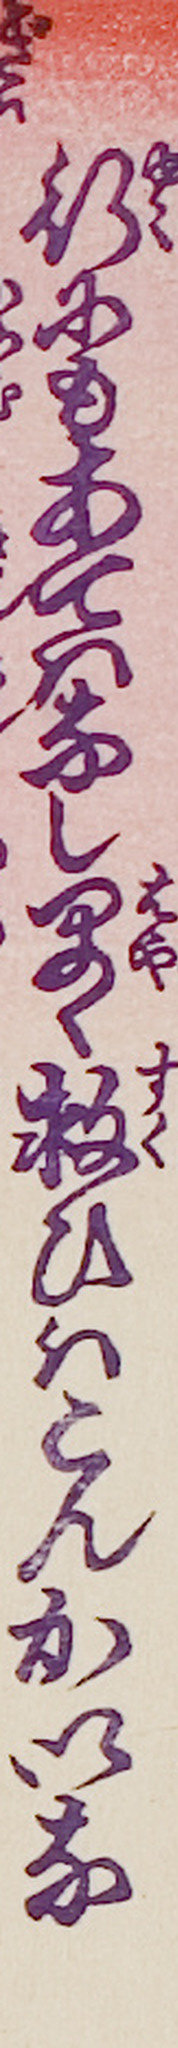行(ゆく)にもあてハなし早く救ひハこんかいな
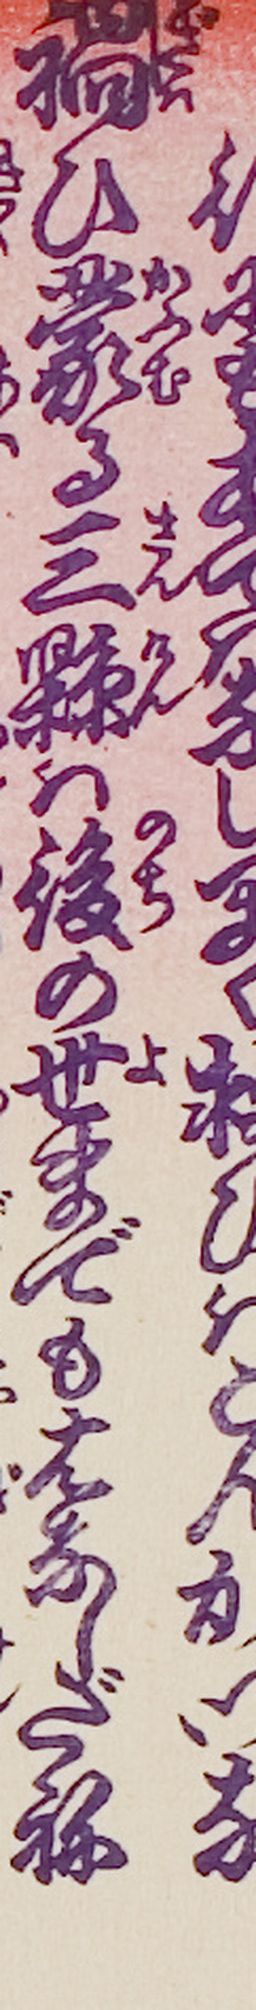乁禍ひ蒙る三縣ハ後の世までもはなしだね
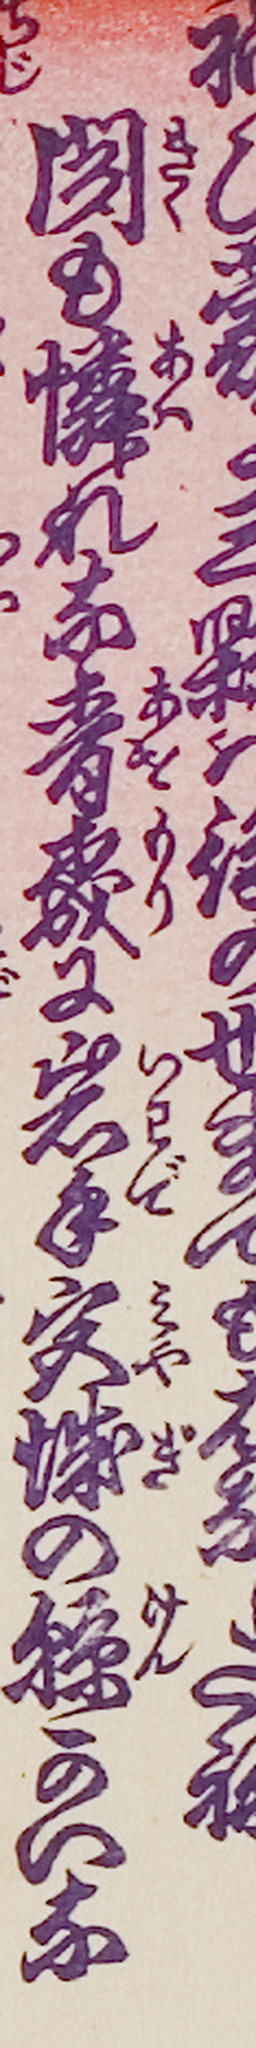聞くも憐れな青森に岩手宮城の縣かいな
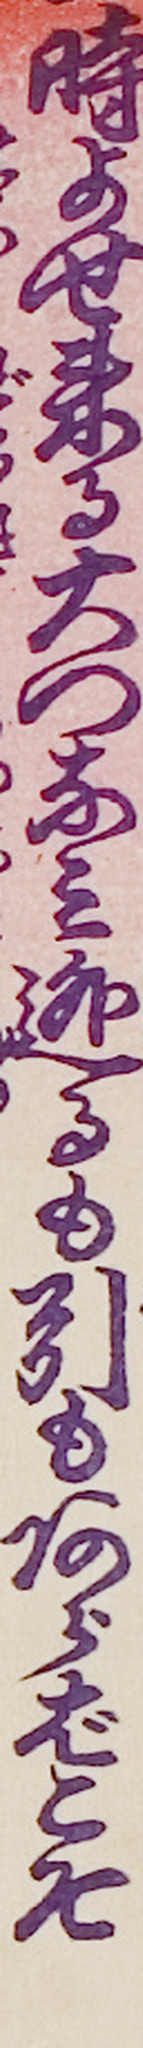乁一時よせ来る大つなミ逃るも引もあらばこそ
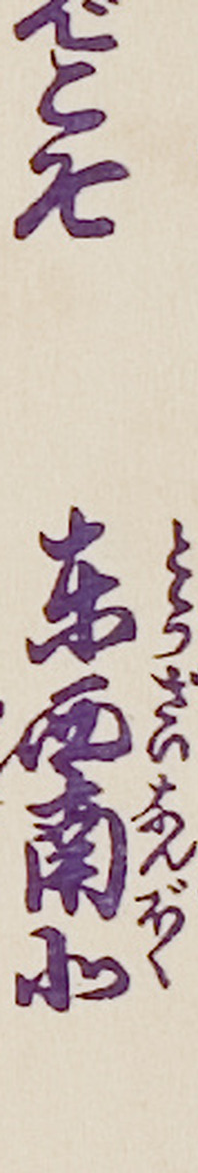東西南北
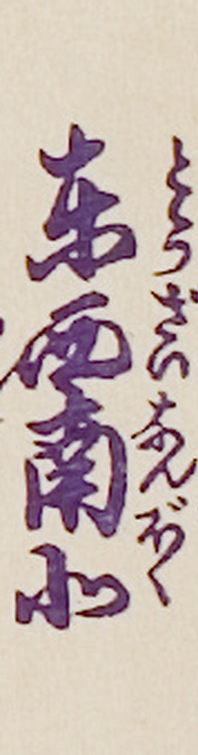東西南北
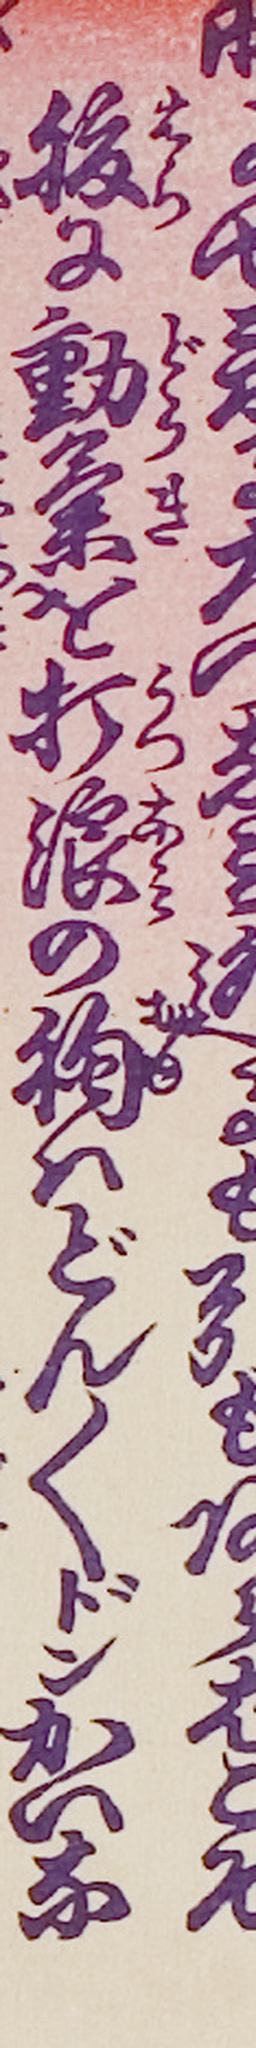腹に動氣をを打浪の胸ハどん〳〵ドンかいな
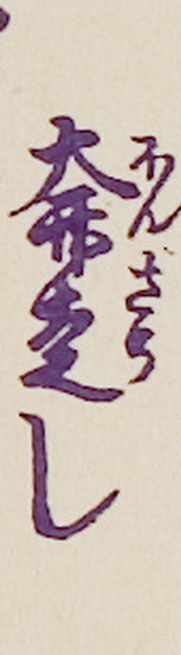奔走し
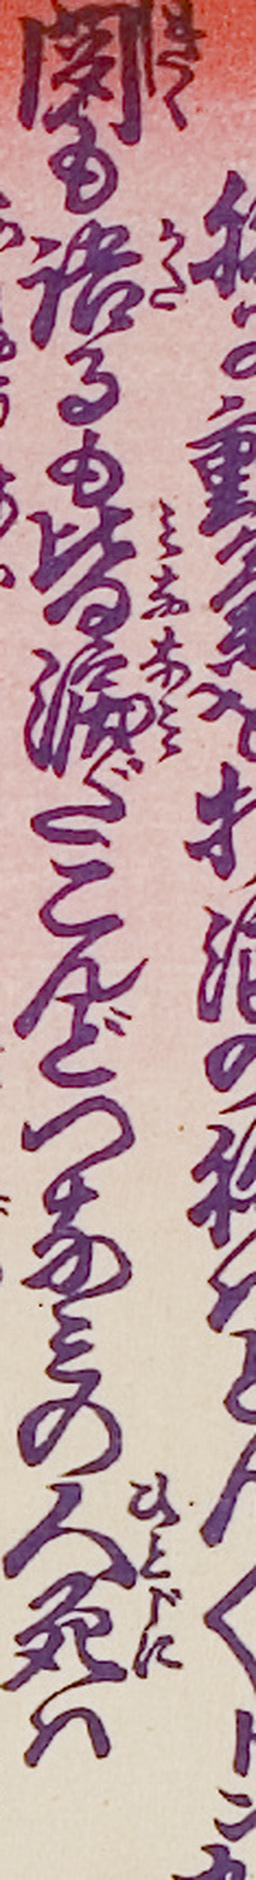乁聞も語るも皆涙だこんどつなみの人死ハ
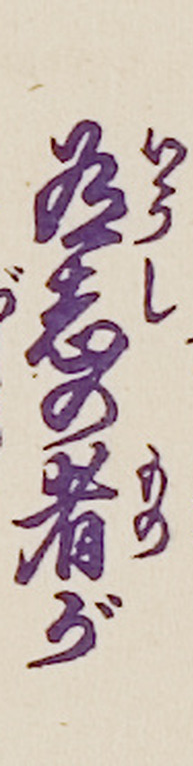有志の者が
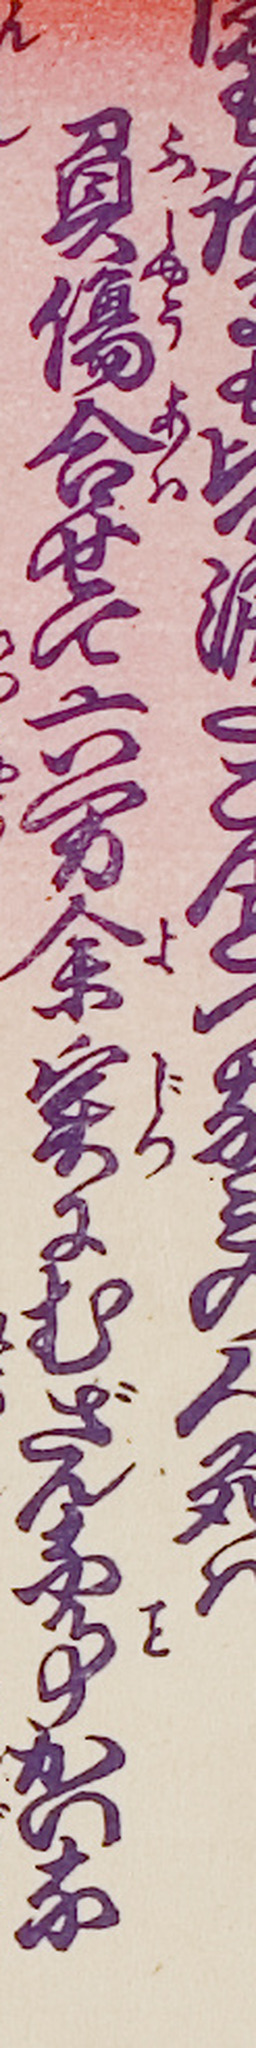負傷合せて六万余實にむざんな事かいな
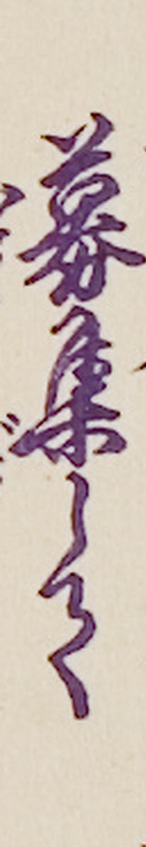募集して
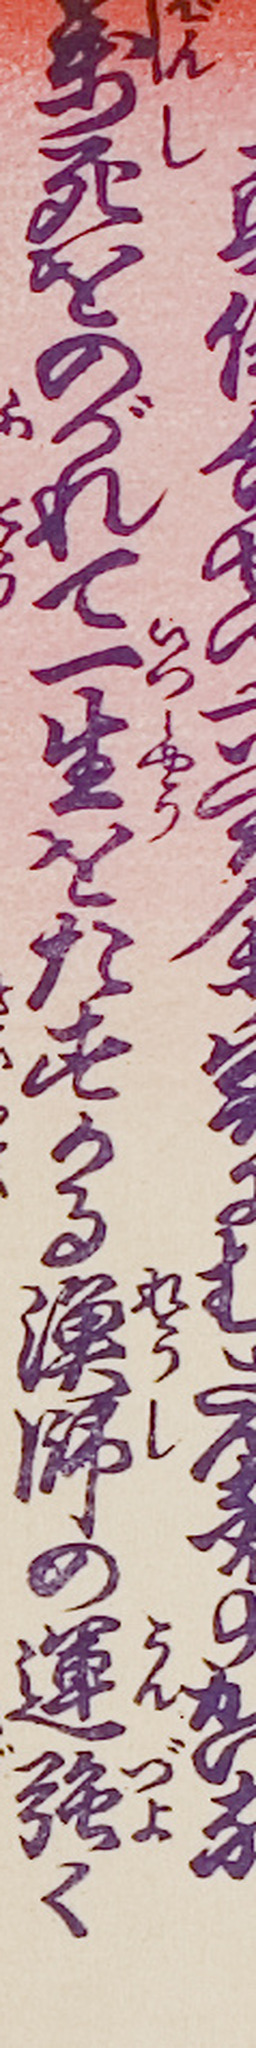乁萬死をのがれて一生をたすかる漁師の運強く
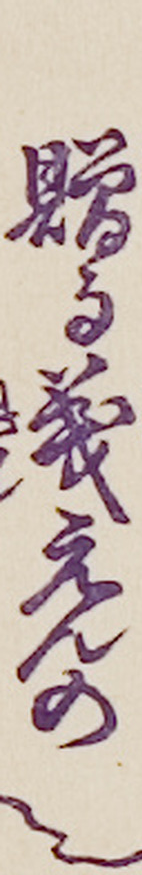贈る義えんの
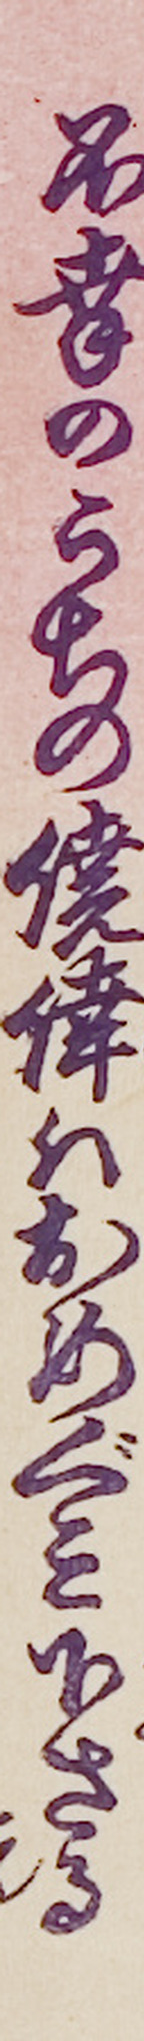不幸のうちの僥倖ハおめぐミ下さる
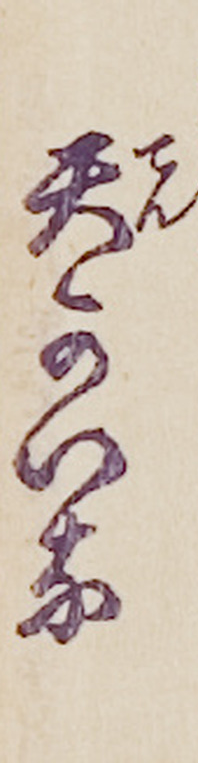天かいな
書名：北陸三県大つなミ一ツトセぶし
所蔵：東京大学総合図書館 General Library in the University of Tokyo, JAPAN
